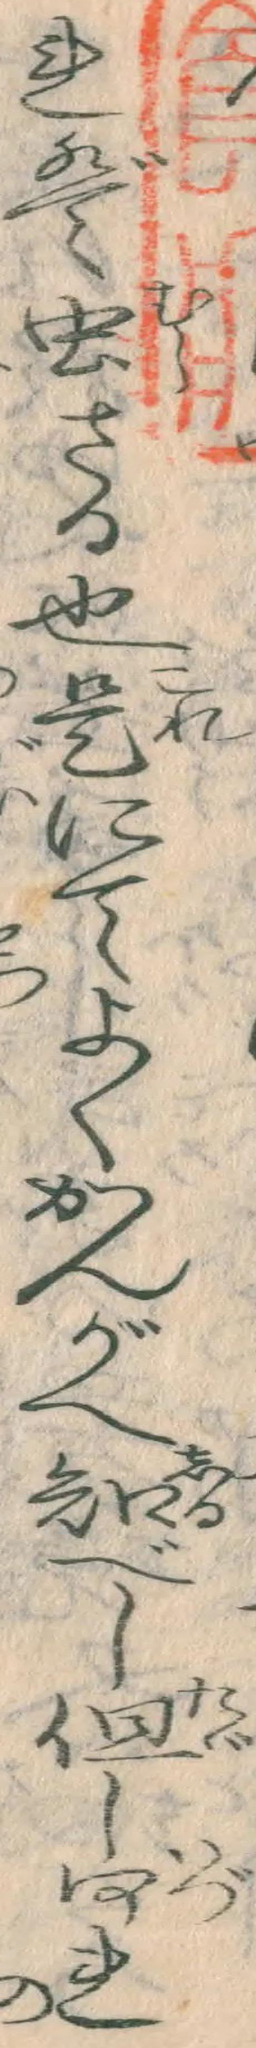れば虫さる也是にてよくかんがへ知べし但し何れの
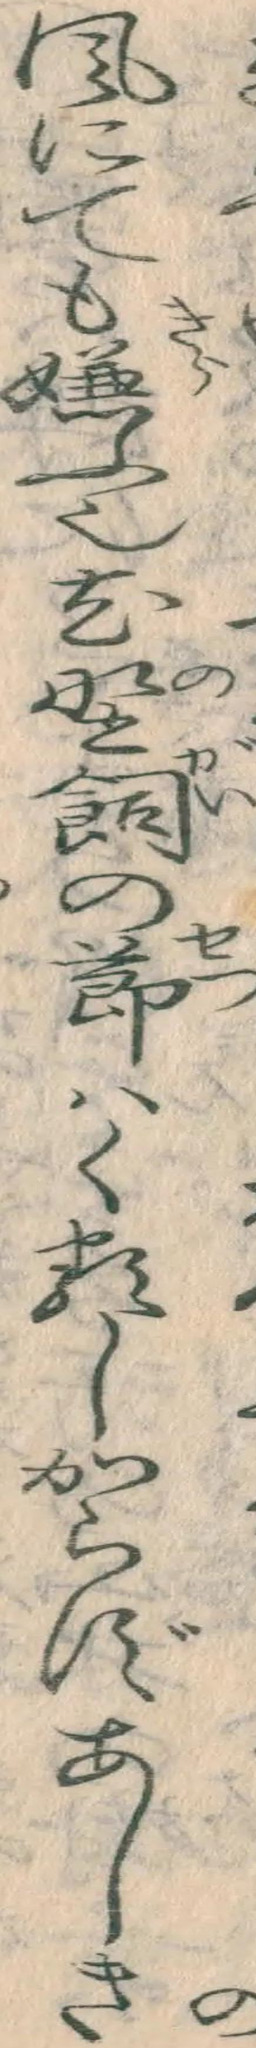風にても嫌ふ也尤野飼の節はくるしからずあしき
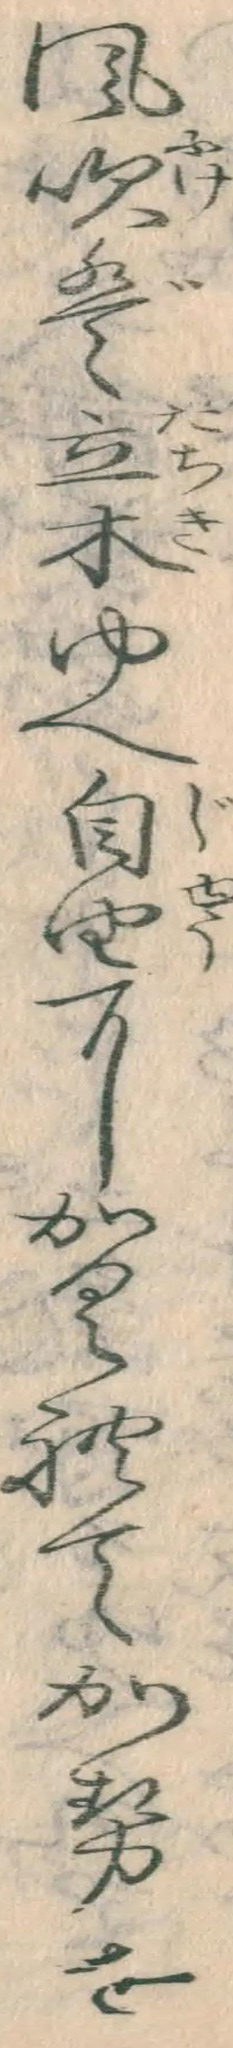風吹ば立木ゆへ自由にかくれてかせを

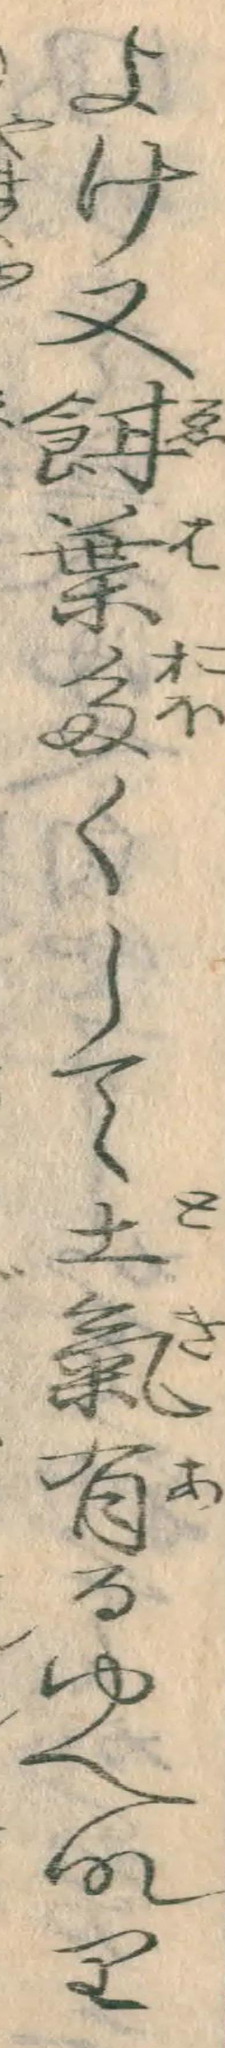よけ又餌葉多くして土氣有るゆへなり
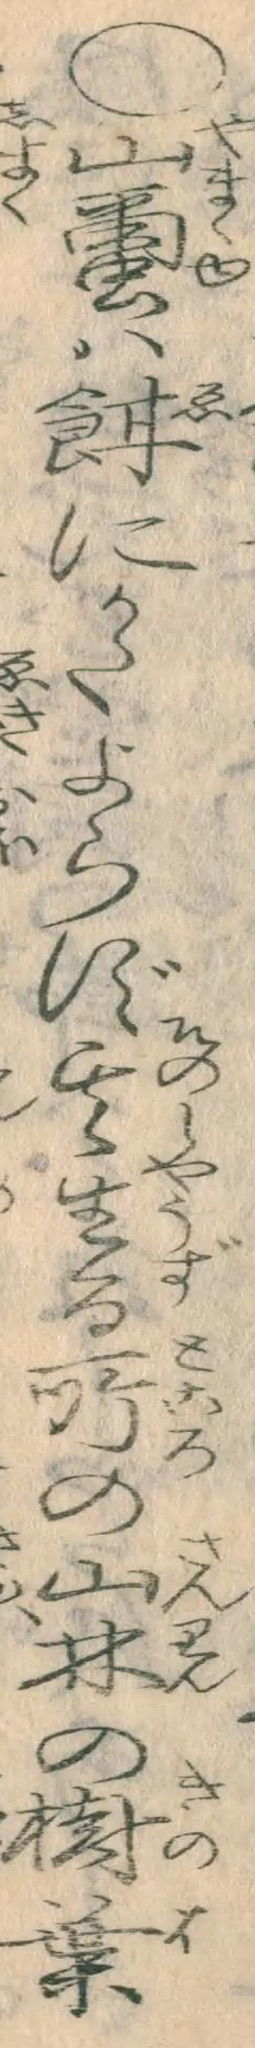○山繭は餌にかたよらず其生る所の山林の樹葉
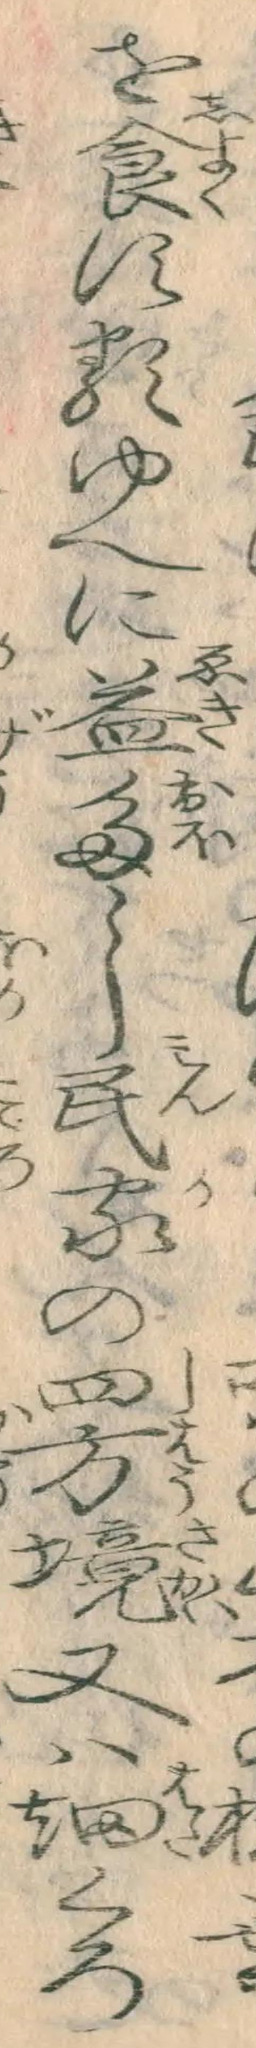を食須類ゆへに益多し民家の四方境又は畑くろ
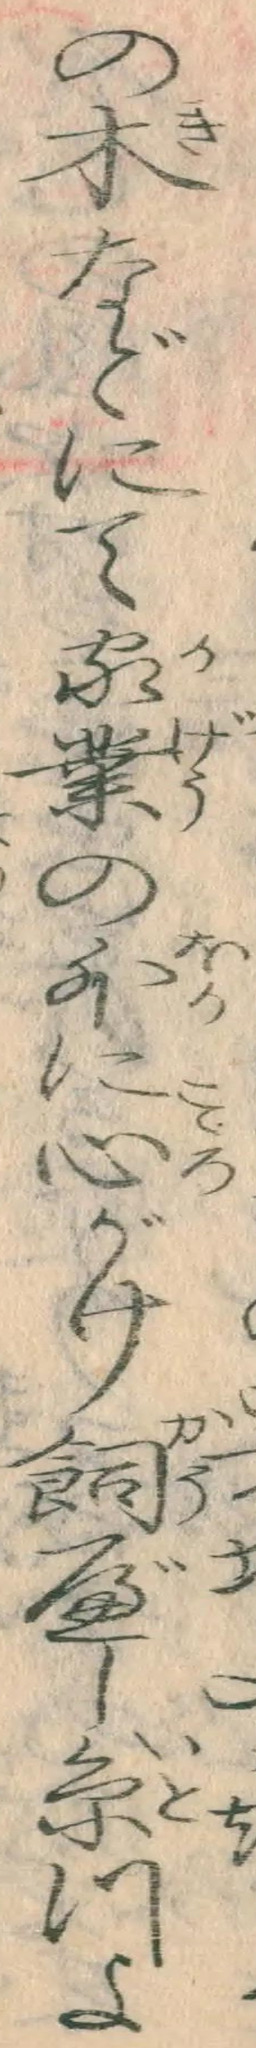の木などにて家業の外に心がけ飼べし糸つよ
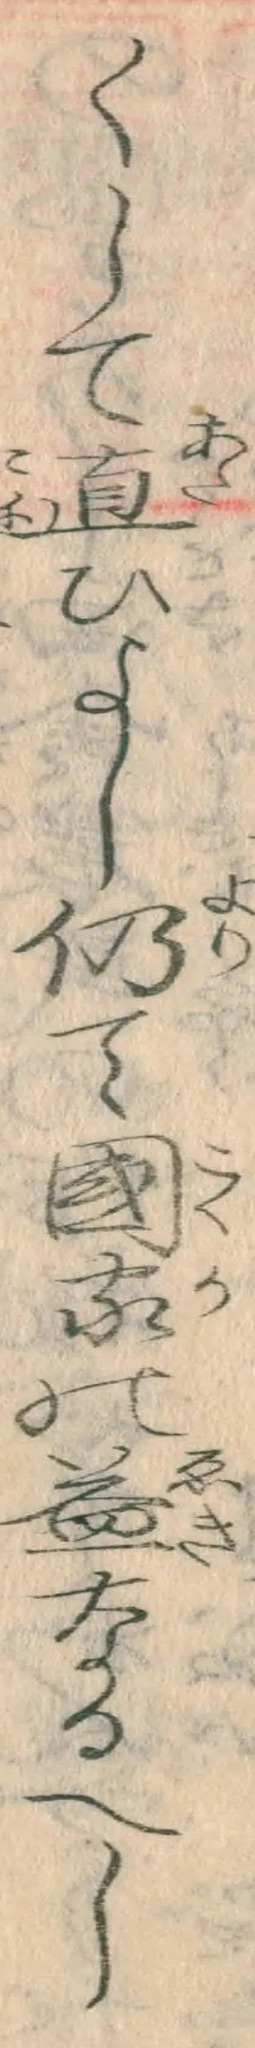くして直ひよし仍て國家の益なるへし
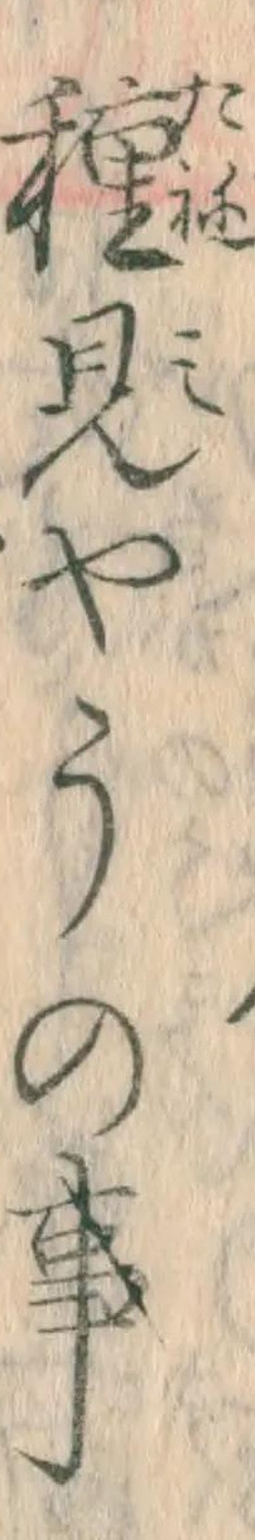種見やうの事
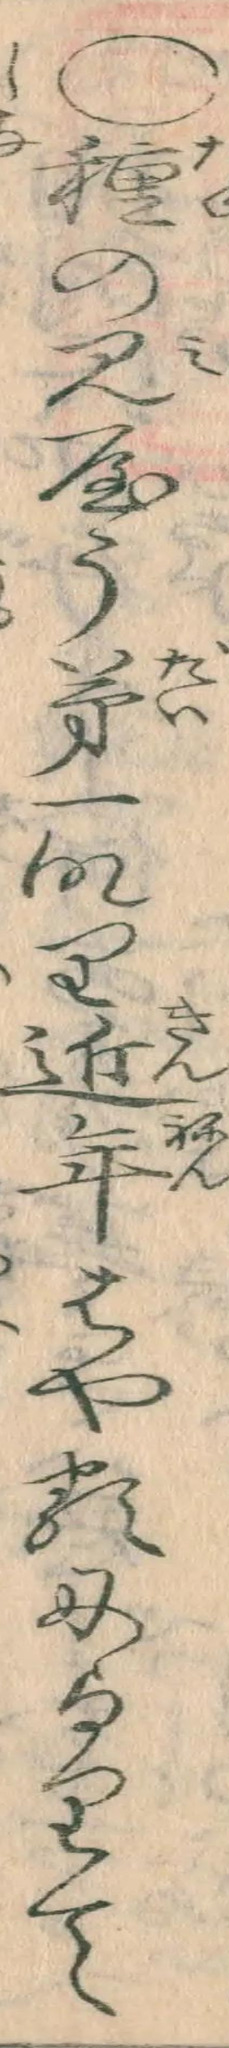○種の見やう第一なり近年はやるによりて
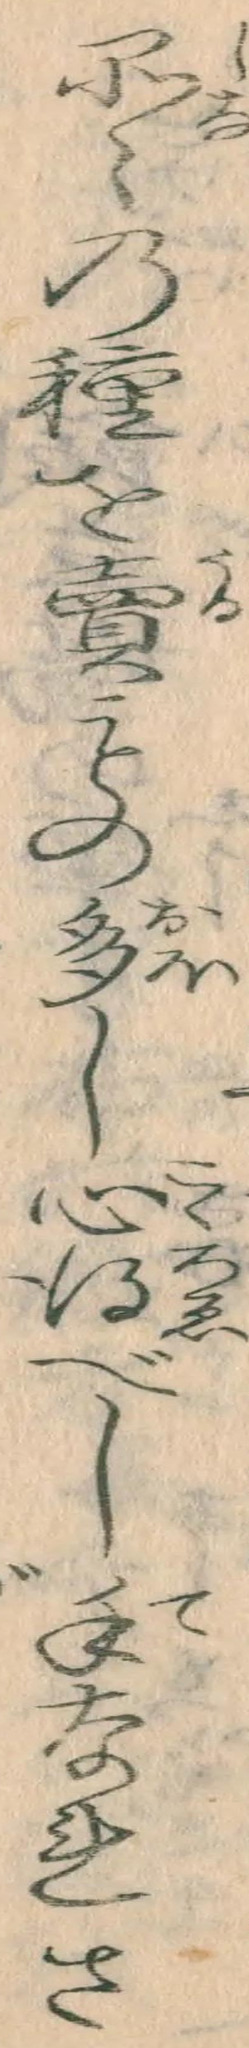品々の種を賣もの多し心得べし手なれさ
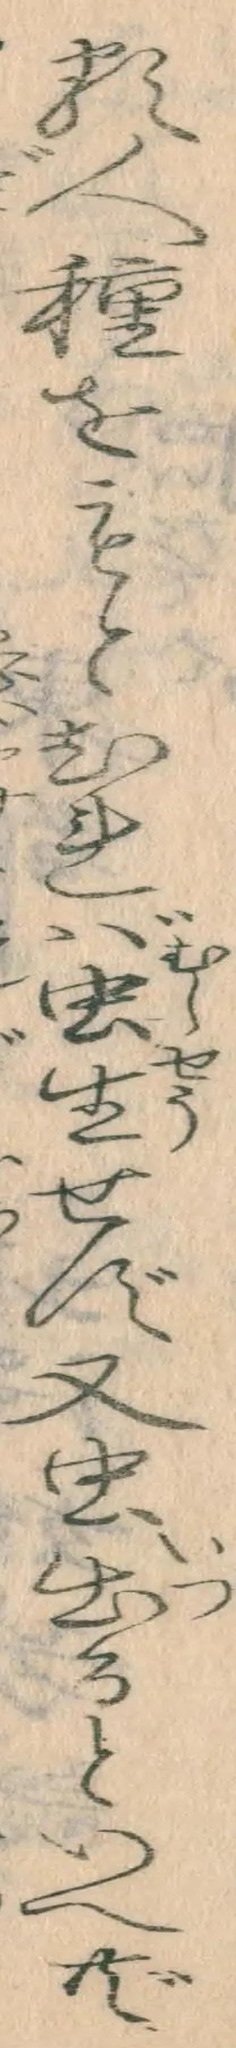る人種をもとむれば虫生せず又虫出るといへ共
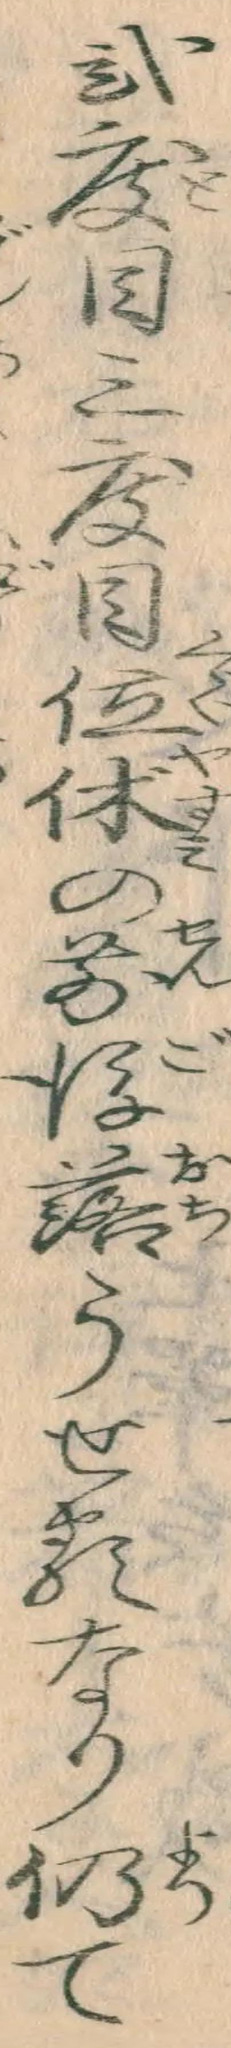弐度目三度目位休の前後落うせるなり仍て
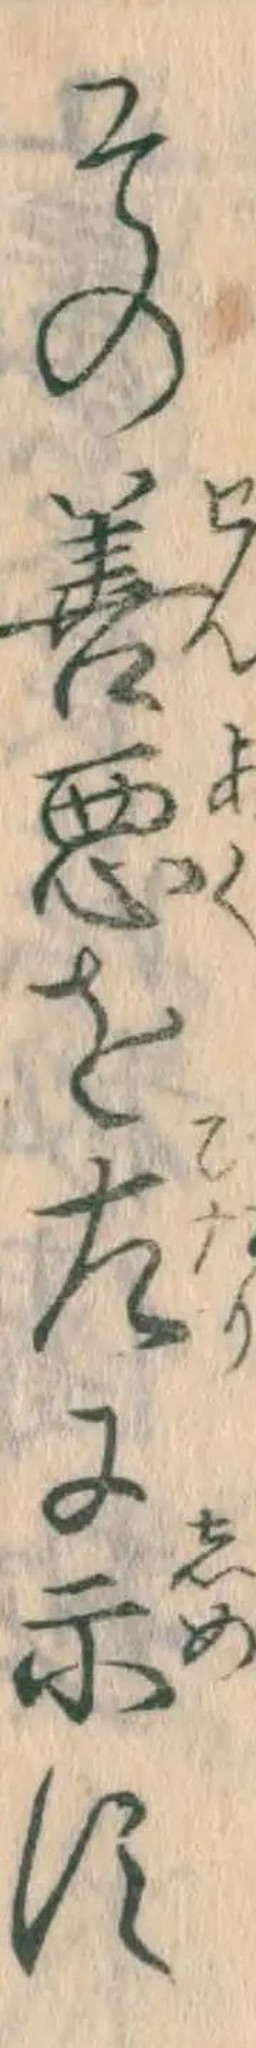その善悪を左に示す
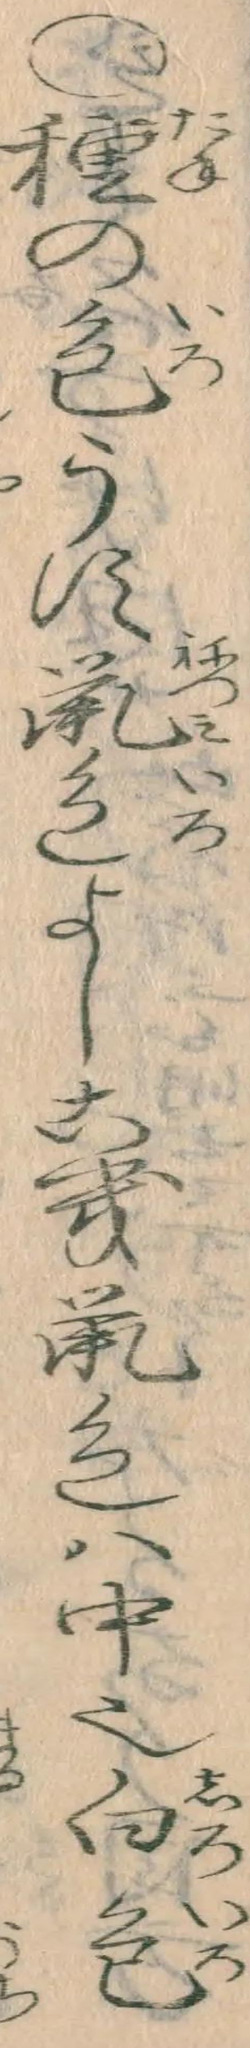○種の色うす鼠色よし古き鼠色は中也白色
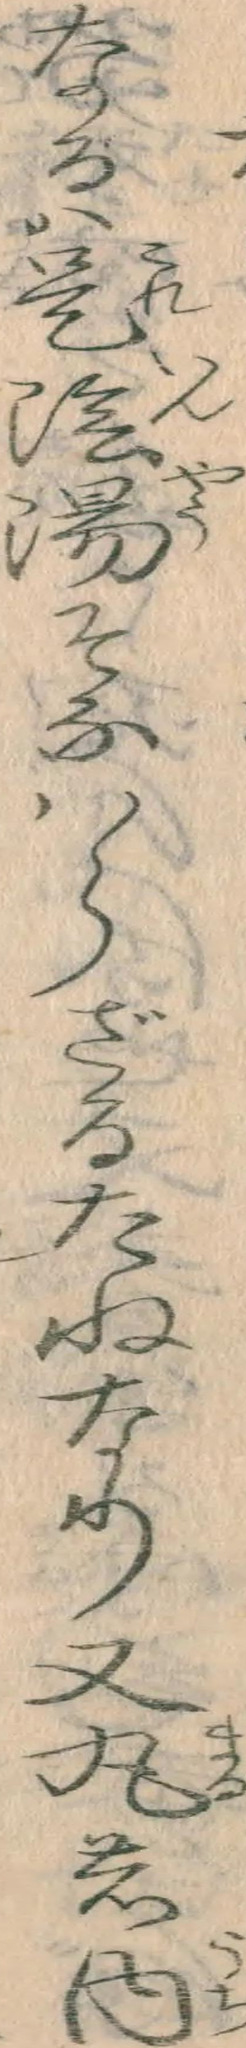なるは是陰陽そなはざるたねなり又丸の内
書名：山繭養法秘傳抄
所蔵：国立国会図書館 National Diet Library, JAPAN
